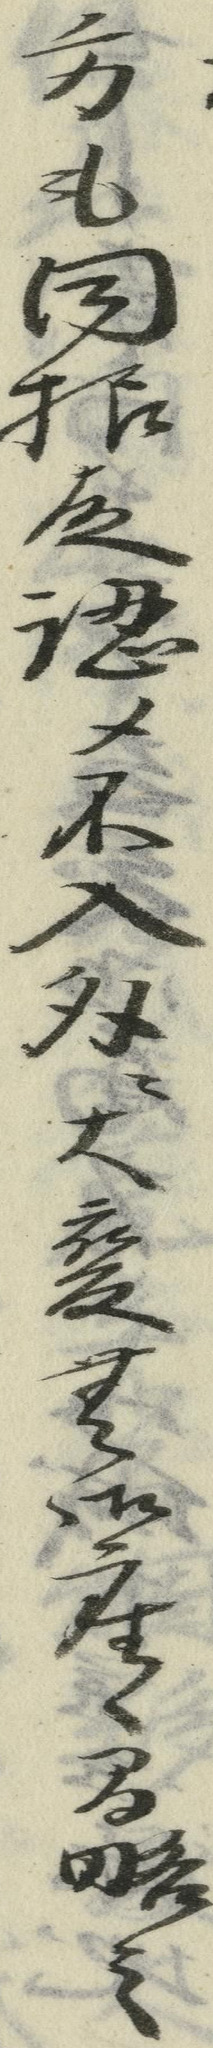方も同様故認メ不入外ニ大変無御座候間略之
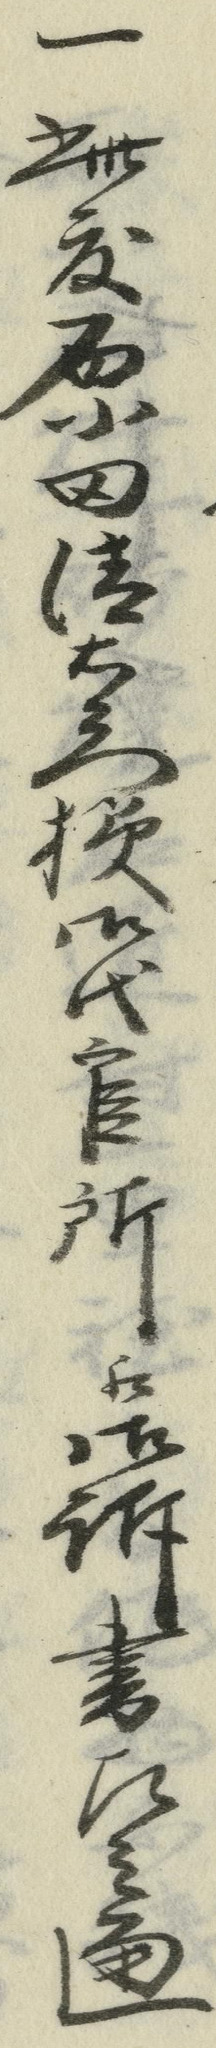一此度原田清右衛門様御代官所江御訴書左之通
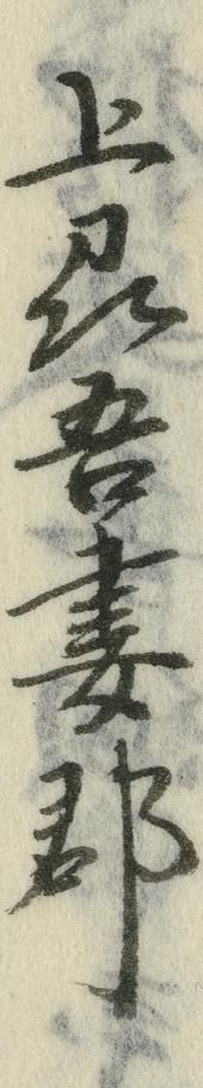上州吾妻郡
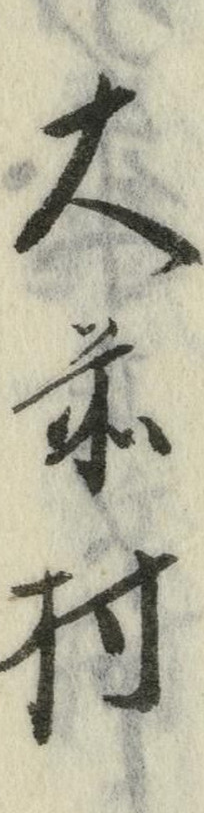大前村
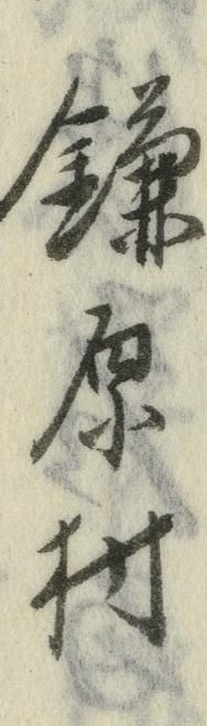鎌原村
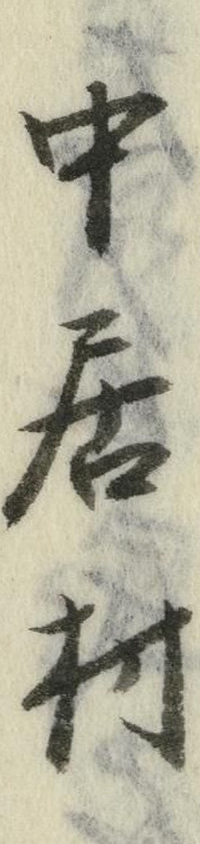中居村
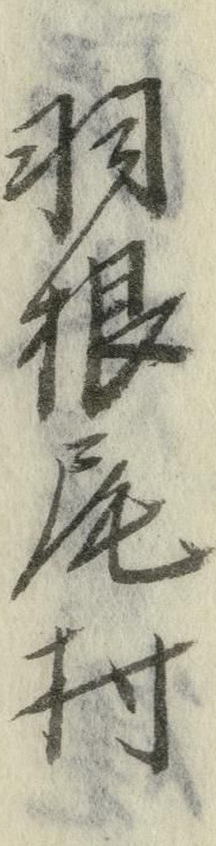羽根尾村
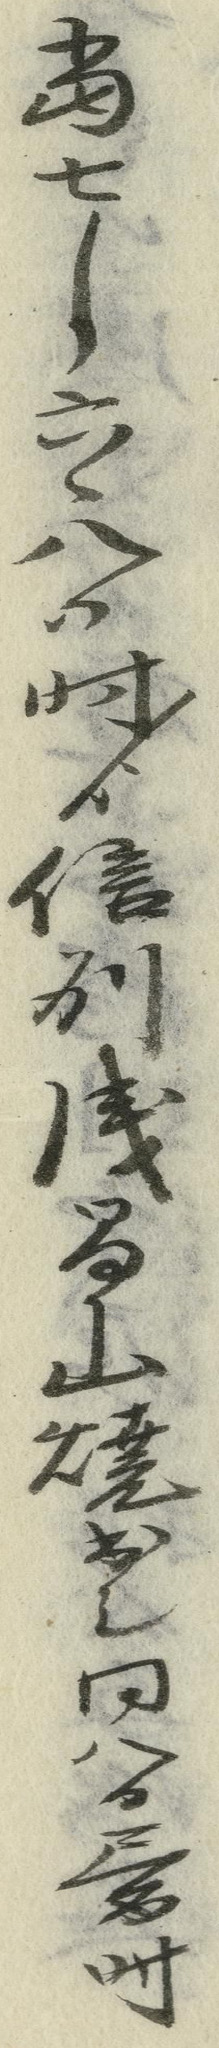当七月六日八ツ時ゟ信州浅間山焼出シ同八日昼時
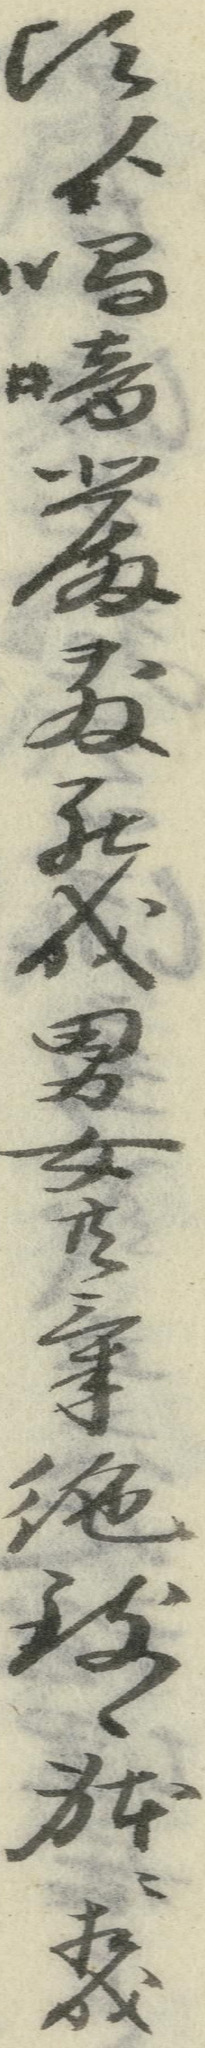頃ゟ鳴暗厳敷罷成男女共気絶致候躰ニ相成
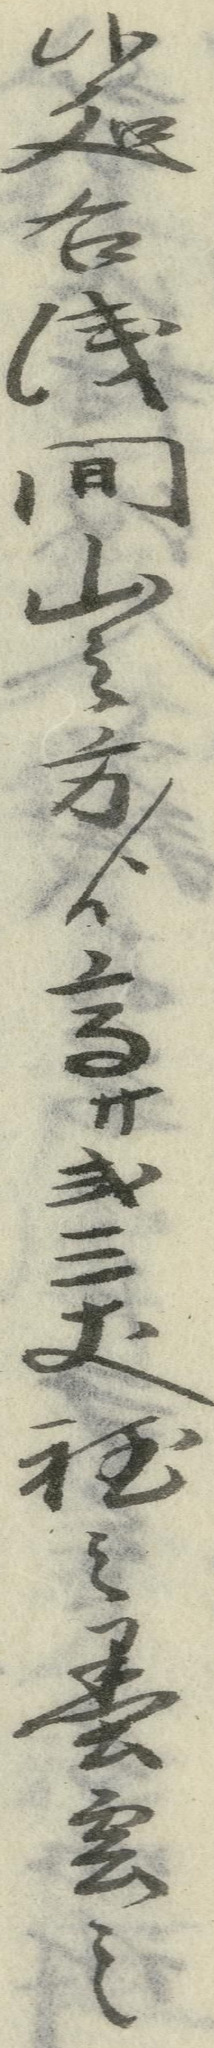候処右浅間山之方ゟ高サ弐三丈程之墨雲之
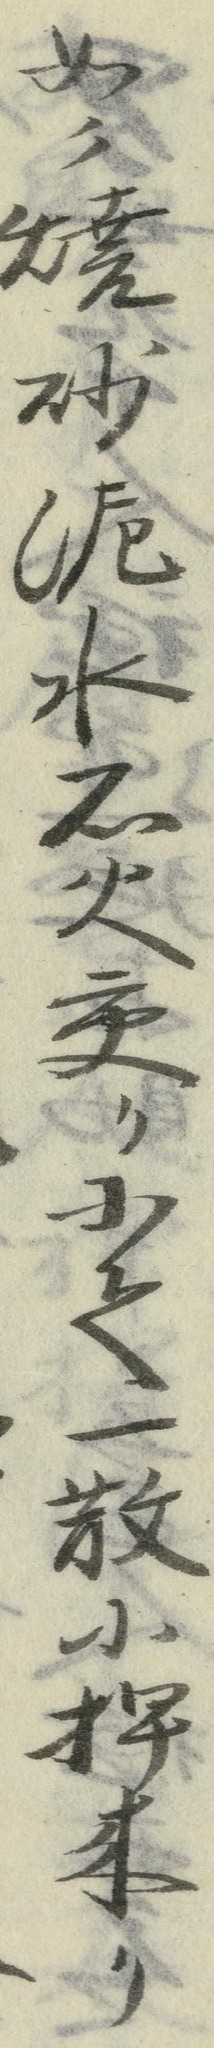如ク焼砂泥水石火交リにて一散に押来リ
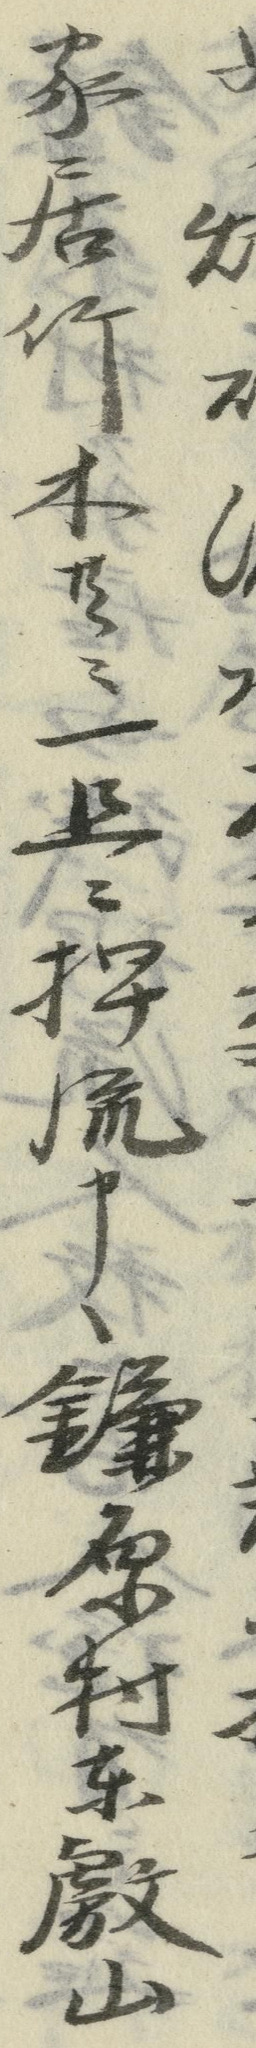家居竹木共々一旦ニ押流申候鎌原村東叡山
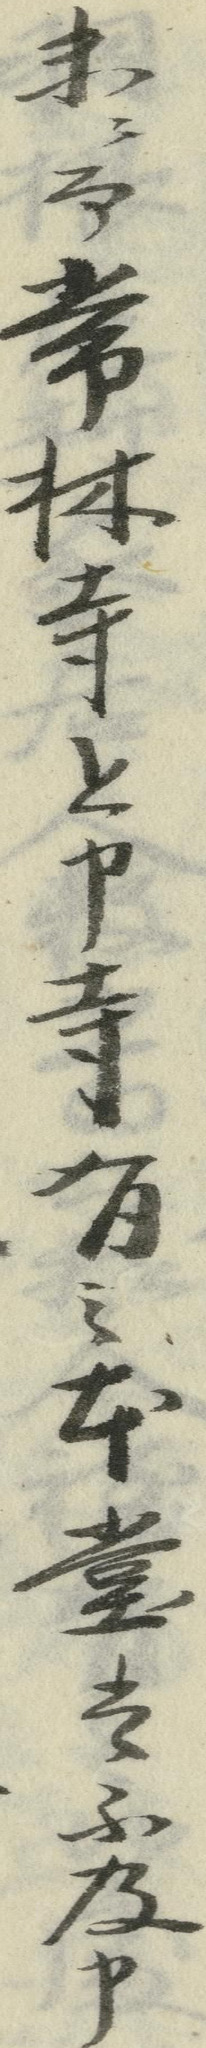末ニテ常林寺と申寺有之本堂は不及申
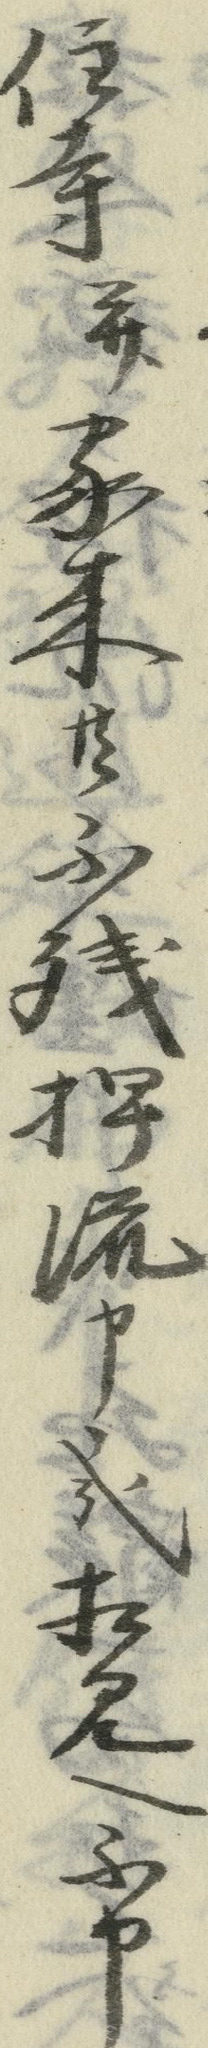住寺并家来共不残押流申候哉相見へ不申
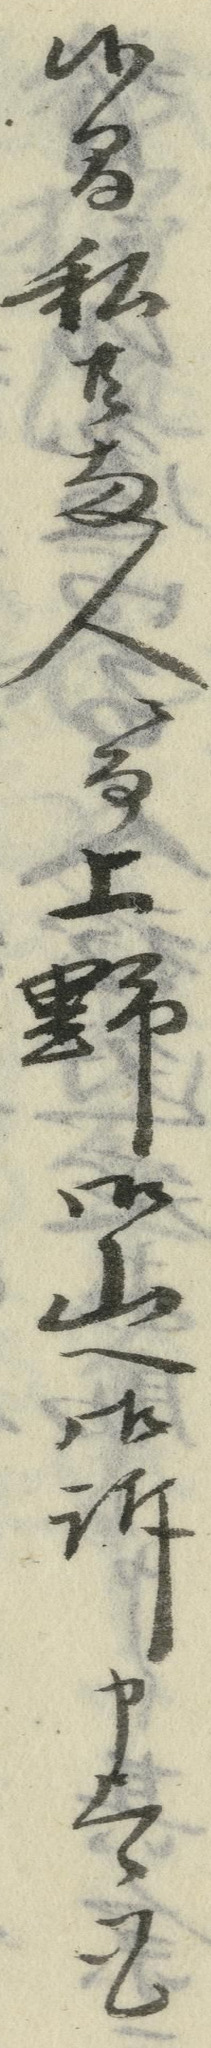候間私共両人ニ而上野御山へ御訴申上候以上
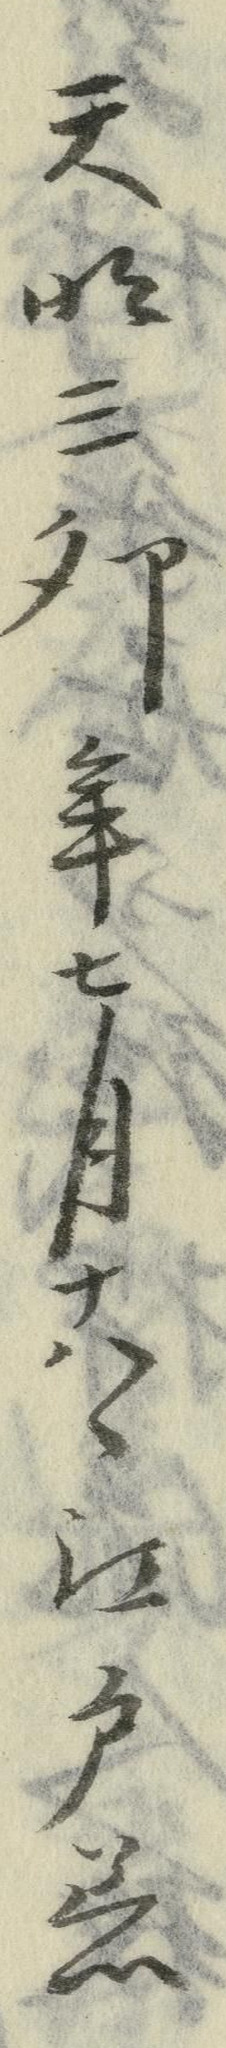天明三卯年七月十八日江戸着
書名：天明三癸卯七月信州浅間山焼出シ上州山津浪ニ付近國ヨリ御届書并訴書写
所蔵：東京大学地震研究所図書室 Earthquake Research Institute Library, The University of Tokyo, JAPAN
